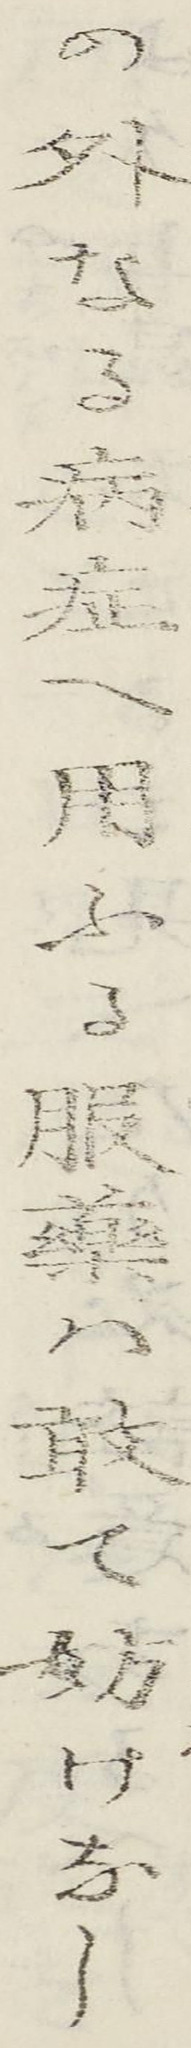の外なる病症へ用ふる服薬は敢て妨けなし
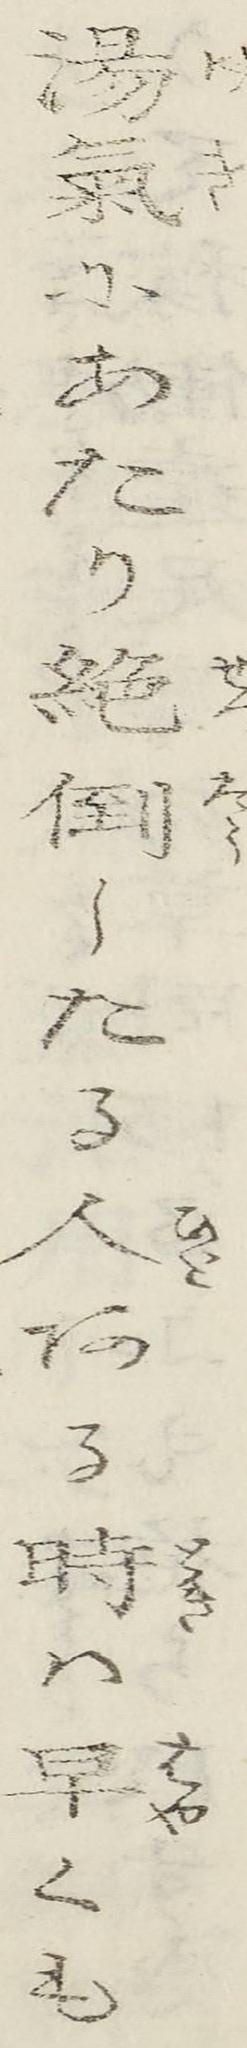湯気にあたり絶倒したる人ある時は早くも
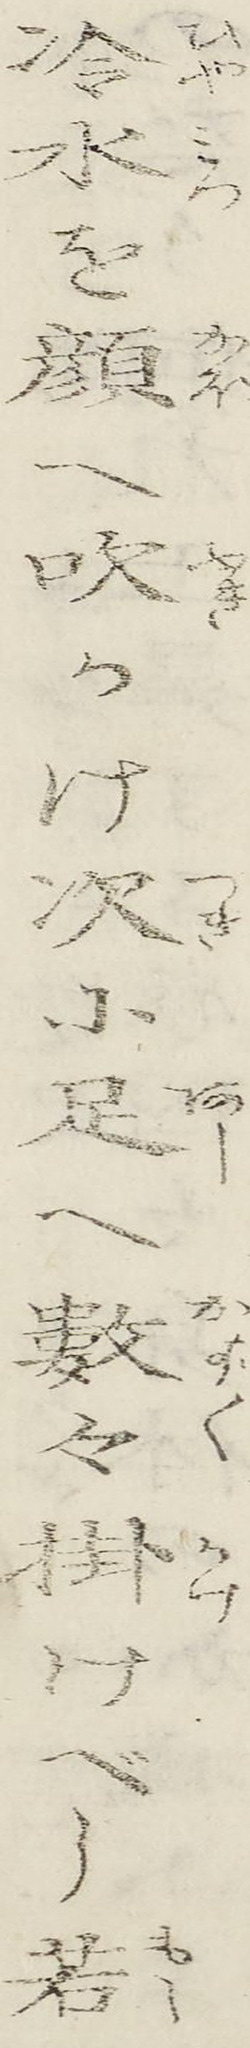冷水を顔へ吹かけ次に足へ数々掛けべし若
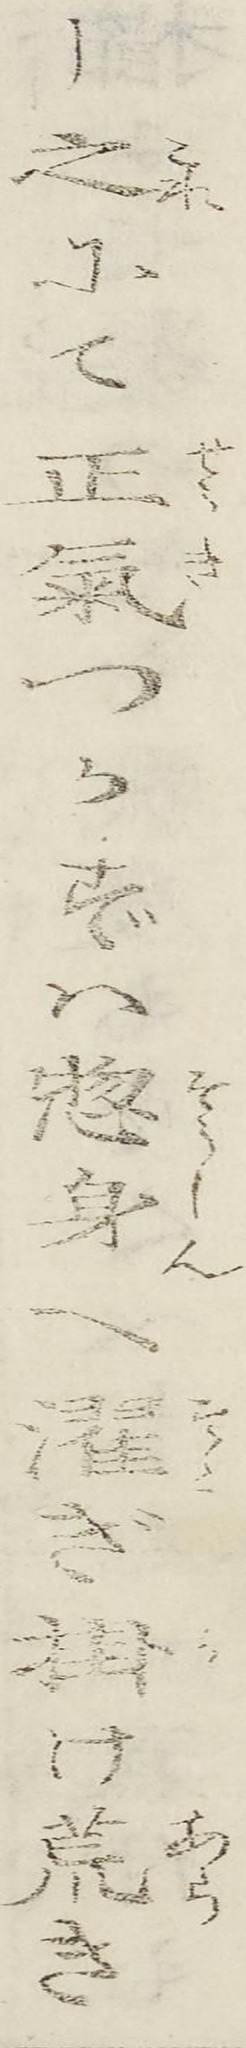し之にて正気つかずは惣身へ濯ぎ掛け荒き

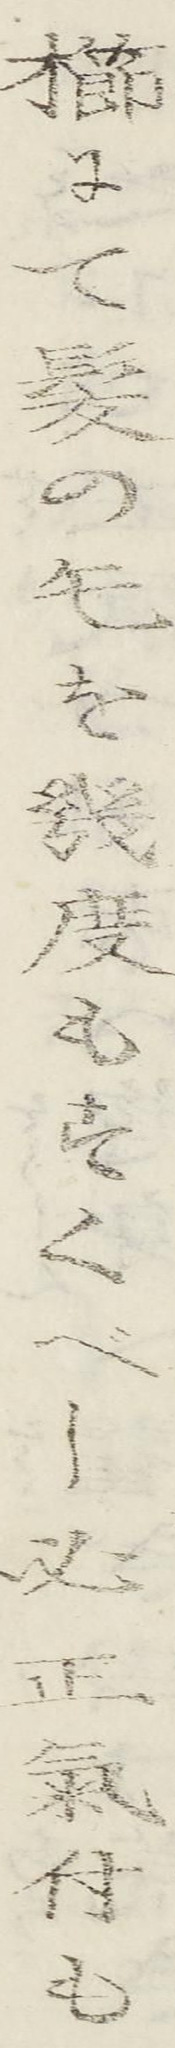櫛にて髪の毛を幾度もすくべし必正気付も
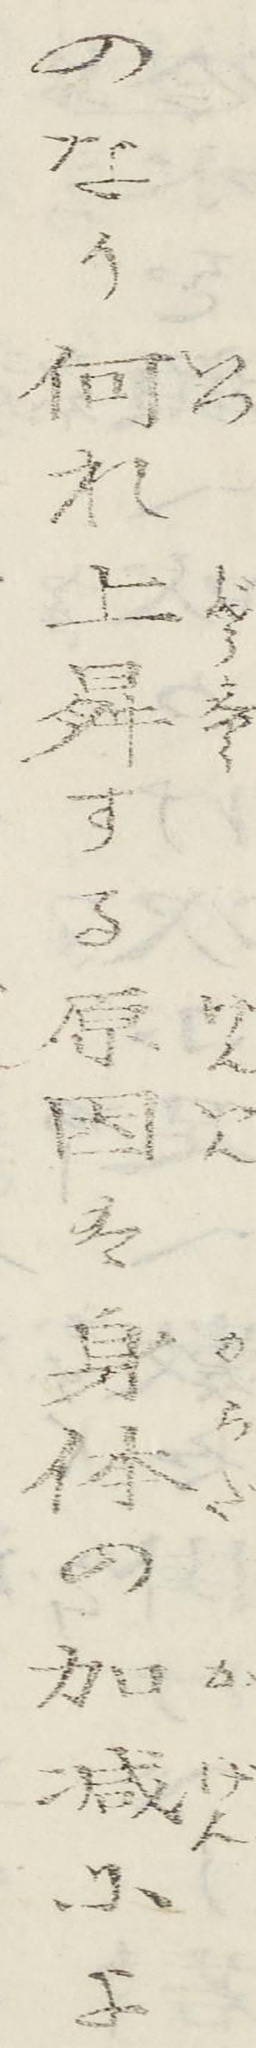のなり何れ上昇する原因は身体の加減によ
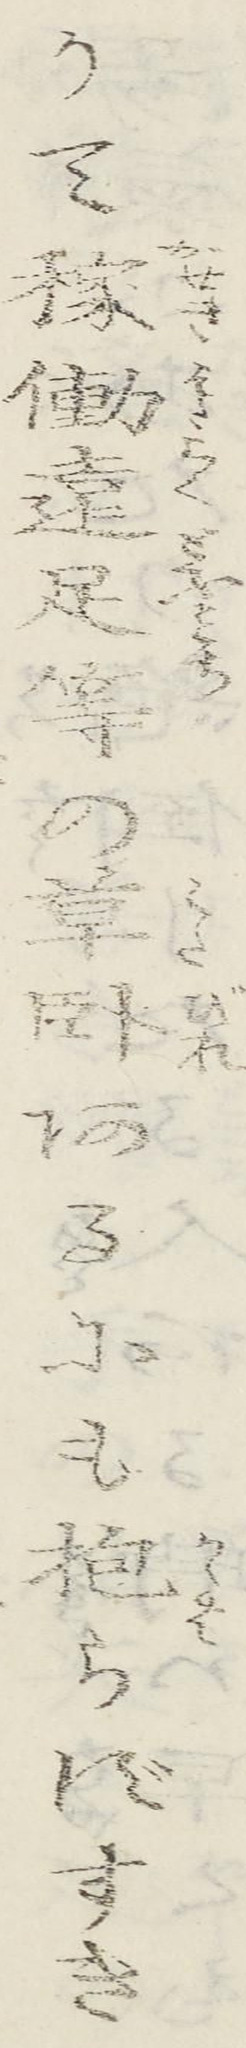りて稼働遠足等の草臥あるにも抱らずすき
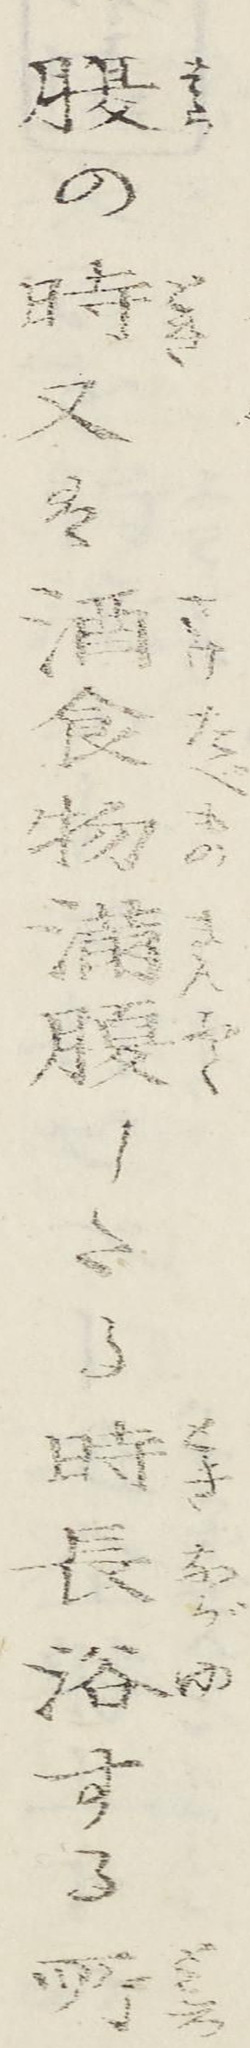腹の時又は酒食物満腹したる時長浴する所
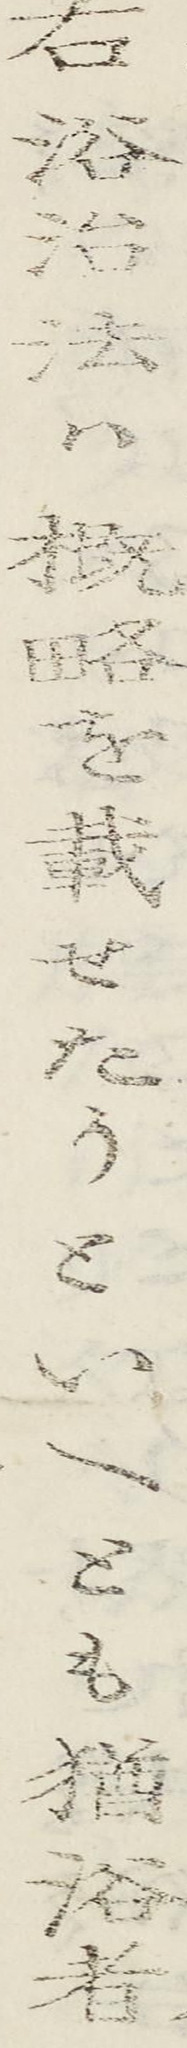右浴治法は概略を載せたりといへとも猶浴者
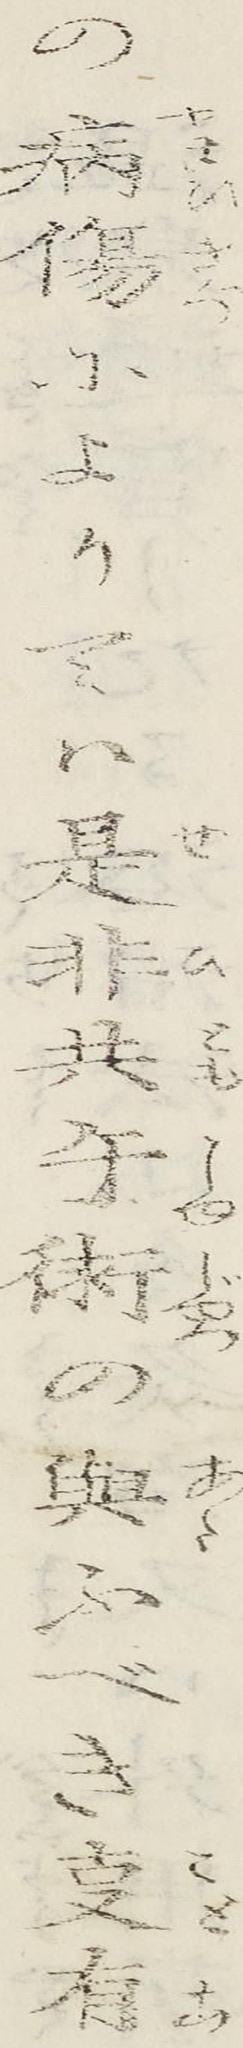の病傷によりては是非共手術の与ふべき事有
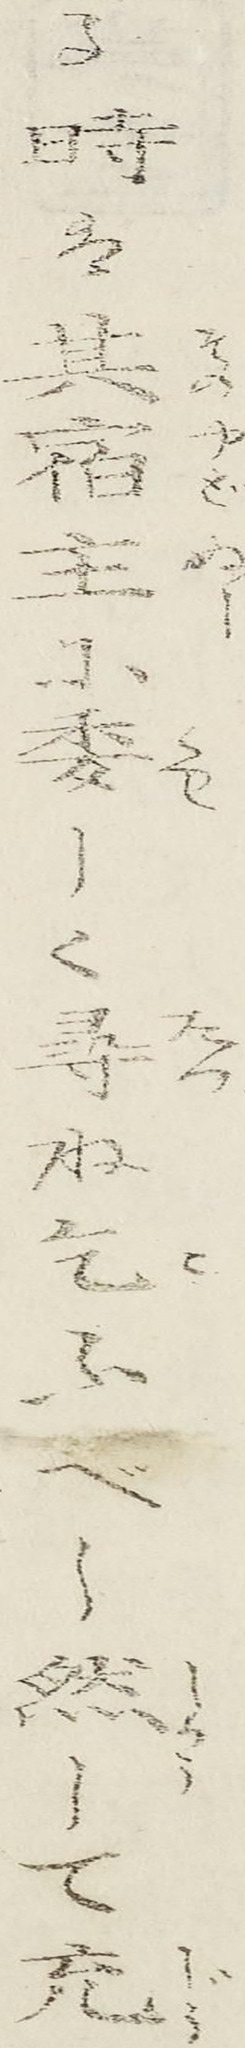る時は其宿主に委しく尋ね乞ふべし然して充
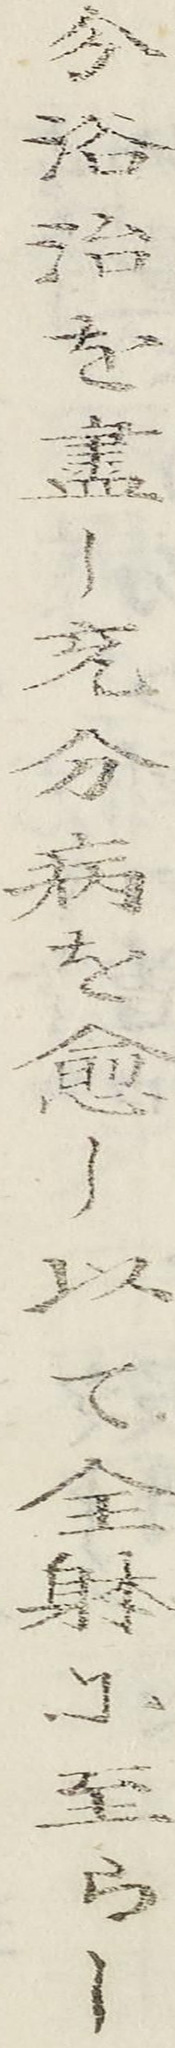分浴治を尽し充分病を愈し以て全体に至らし
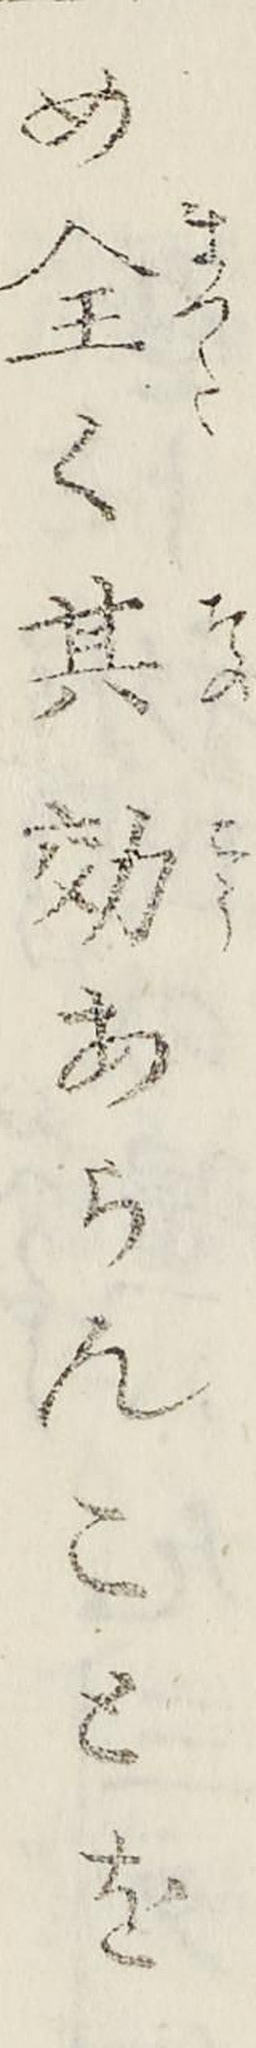め全く其効あらんことを
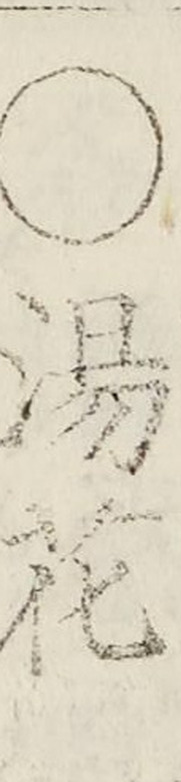○湯花
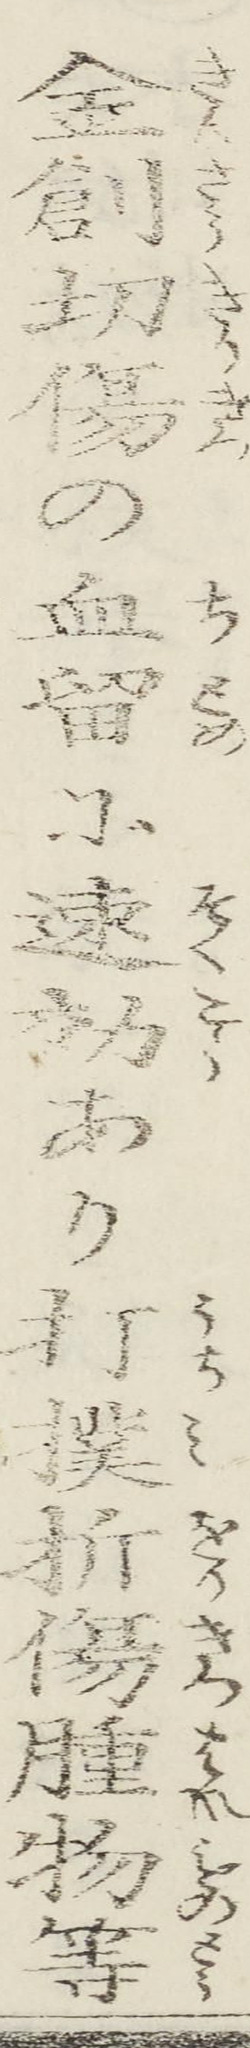金創切傷の血留に速効あり打撲折傷腫物等
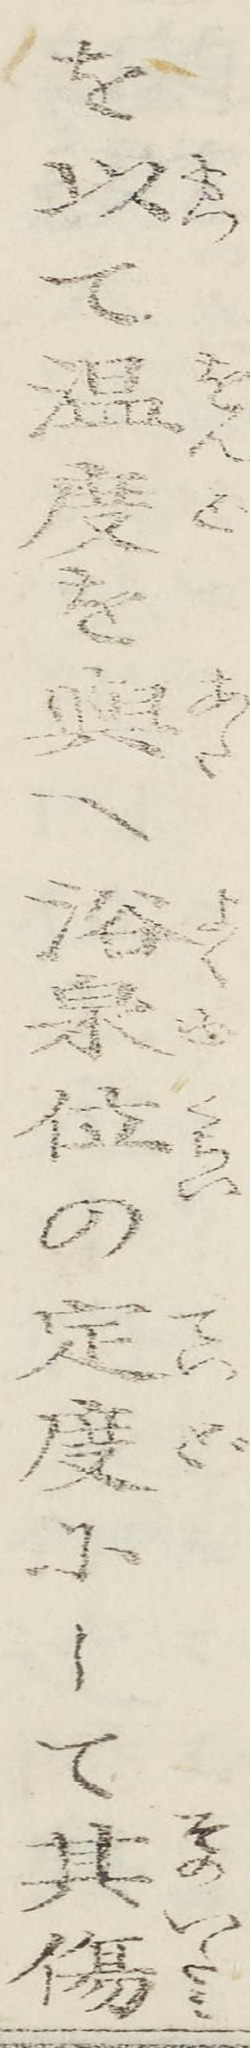を以て温度を与へ浴泉位の定度にして其傷
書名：鎌先温泉由來記
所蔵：東京大学地震研究所図書室 Earthquake Research Institute Library, The University of Tokyo, JAPAN
